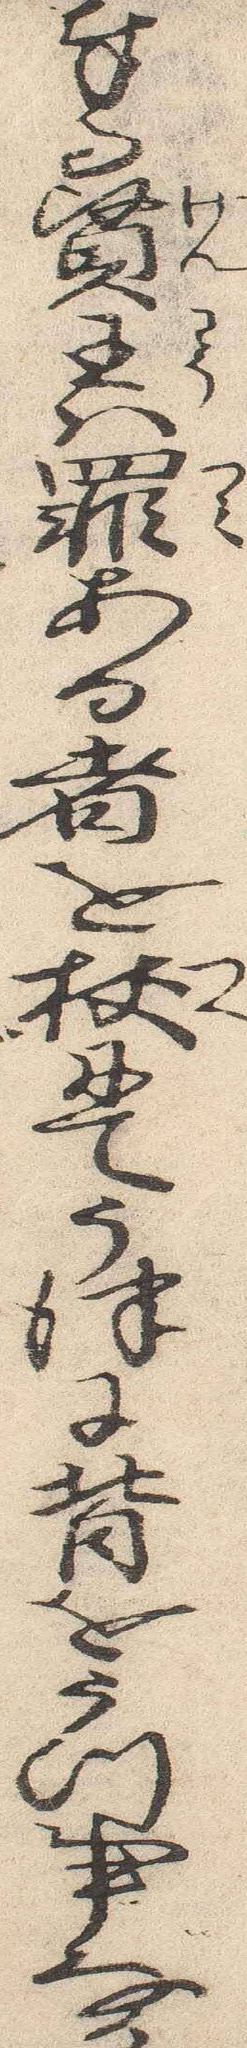奉る賢王は罪ある者を杖にてうつに背をうつ事なか
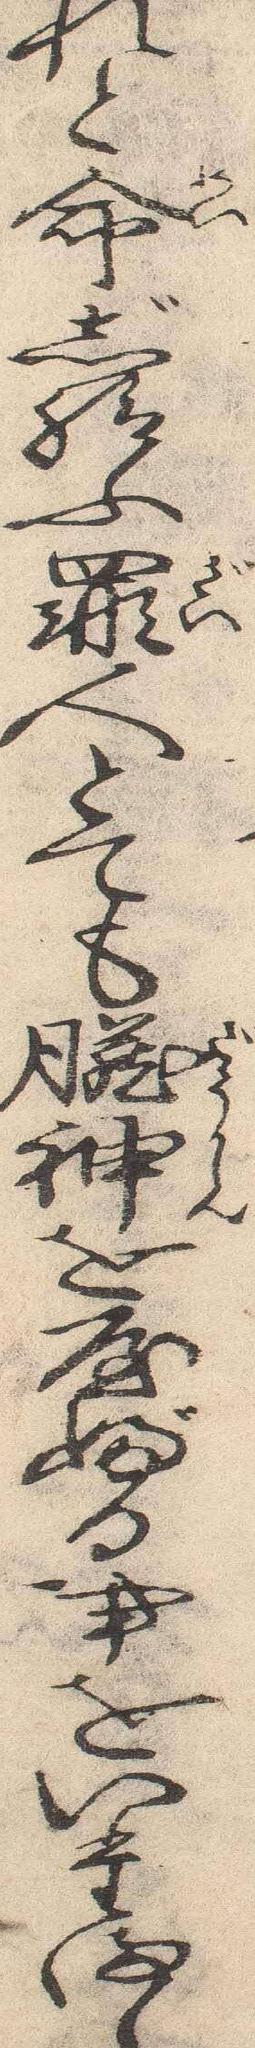れと命じ給ふ罪人とても臓神をやぶる事をいたまし
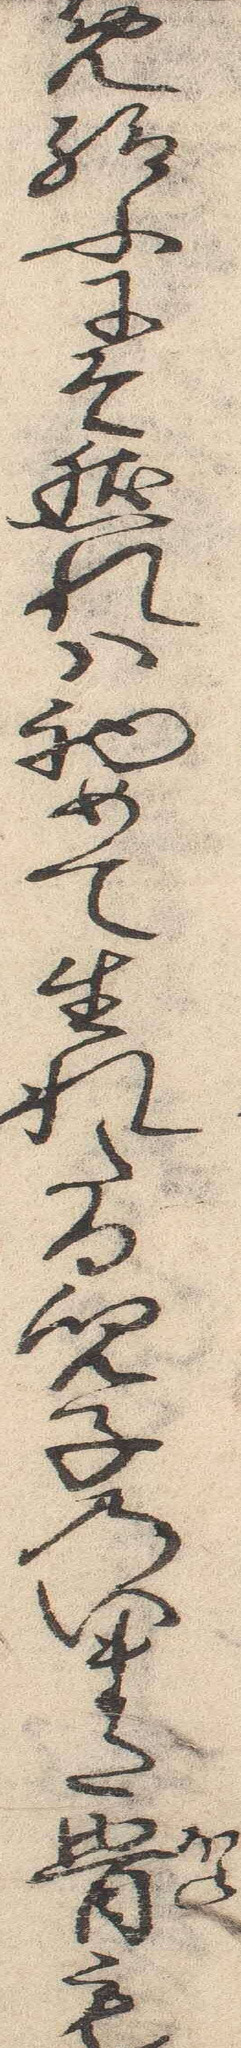め給ふにそ然れは初めて生れたる児子のいまた骨も
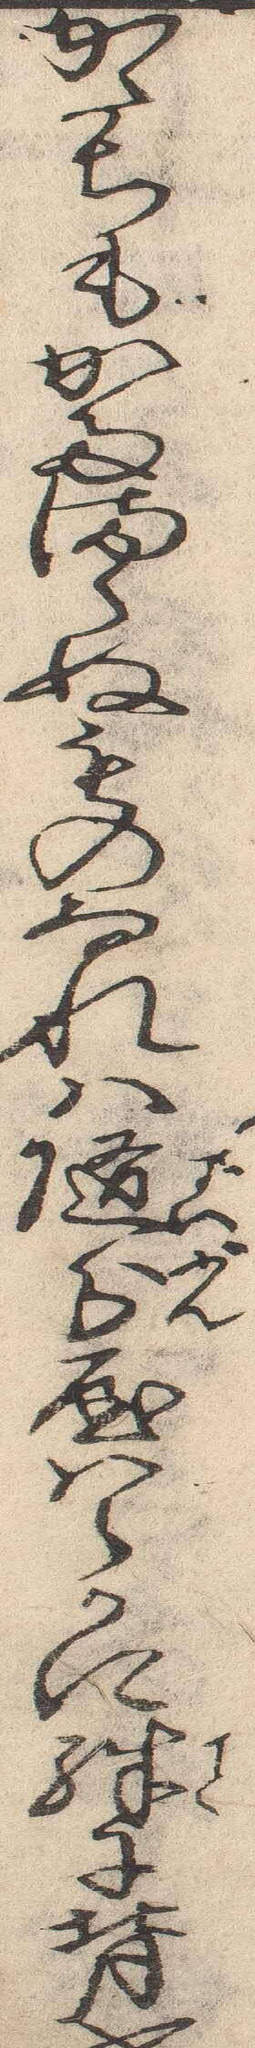かたちもかたまらぬものなれは随分やはらかに殊に背を
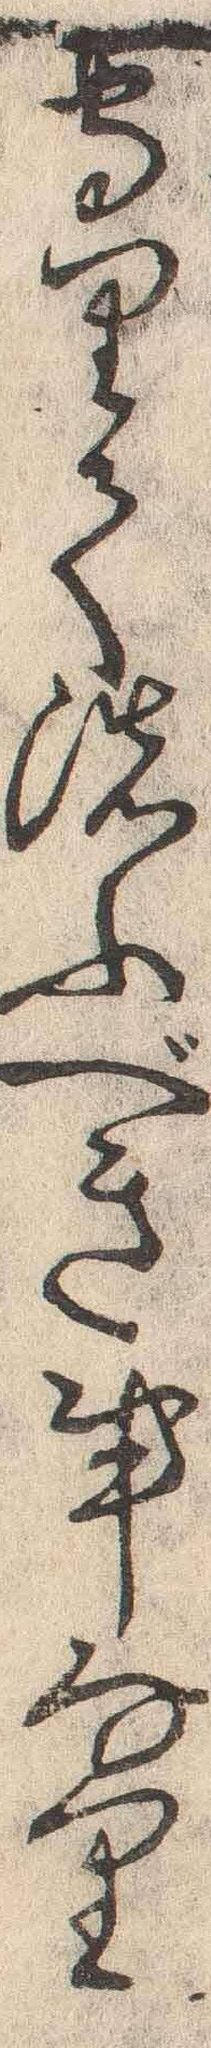守りて洗うべき事なり
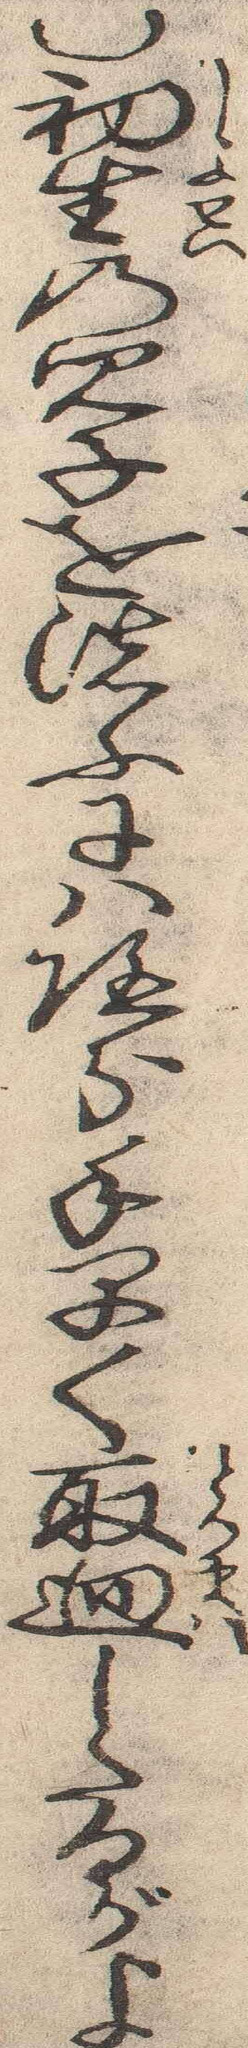◯初生の児子を洗ふには随分手早く取廻したるがよ
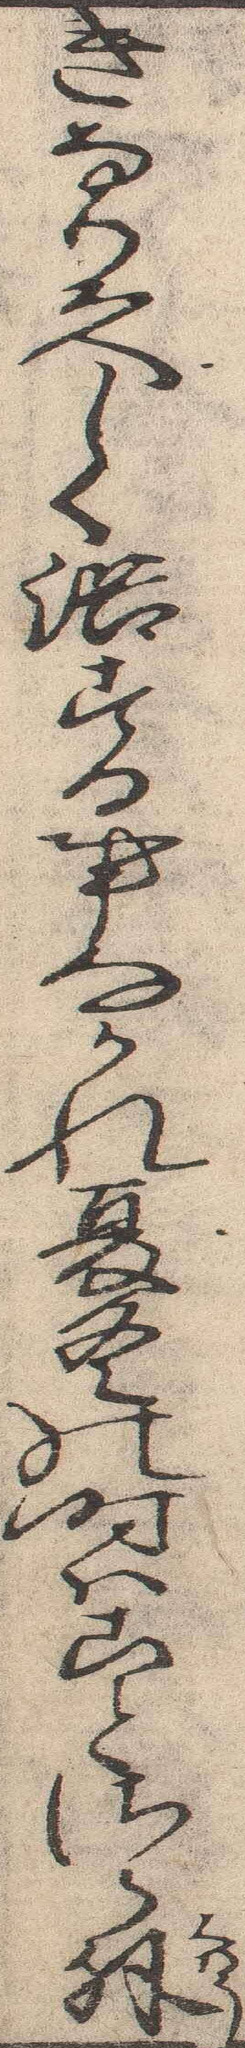きなり久しく浴する事なかれ夏冬の時はことさら外

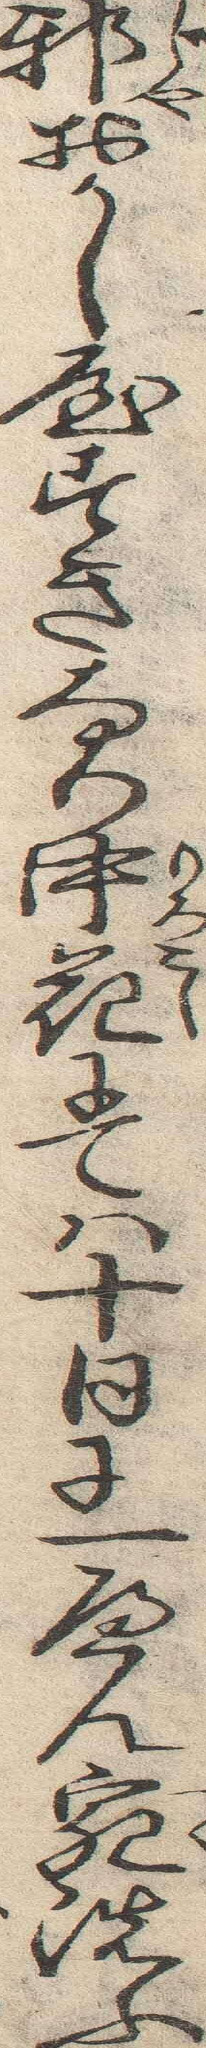邪おかしやすきなり中花にては十日に一へん宛洗ふ
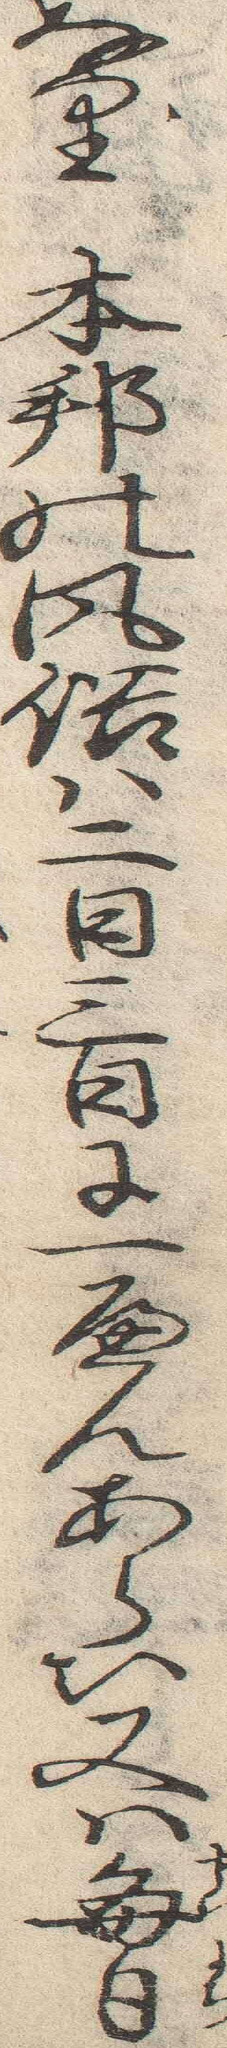なり本邦の風俗は二日三日に一へんあらひ又は毎日
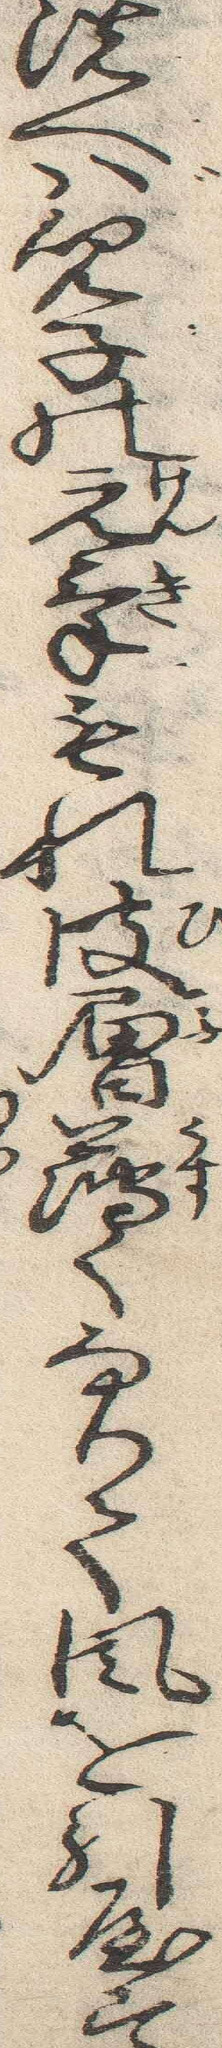洗へば児子の元氣もれ皮層薄くなりて風を引やす
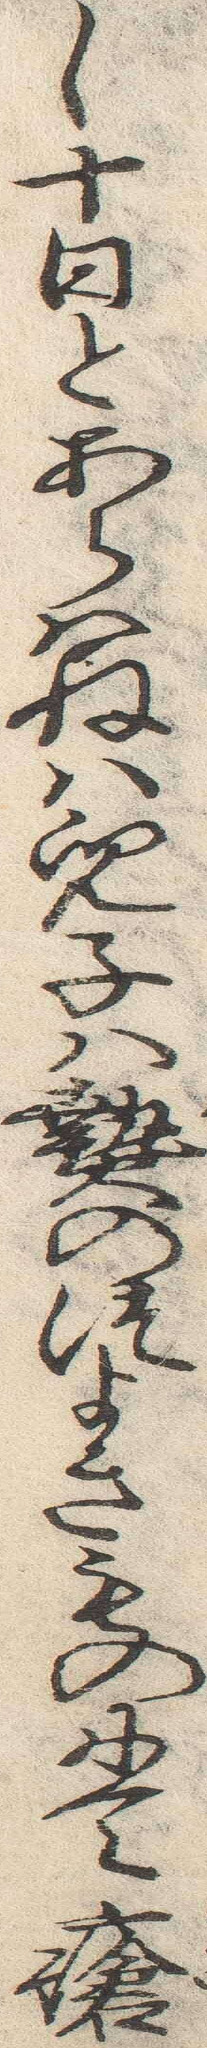し十日とあらはねは児子は熱のつよきものにて瘡
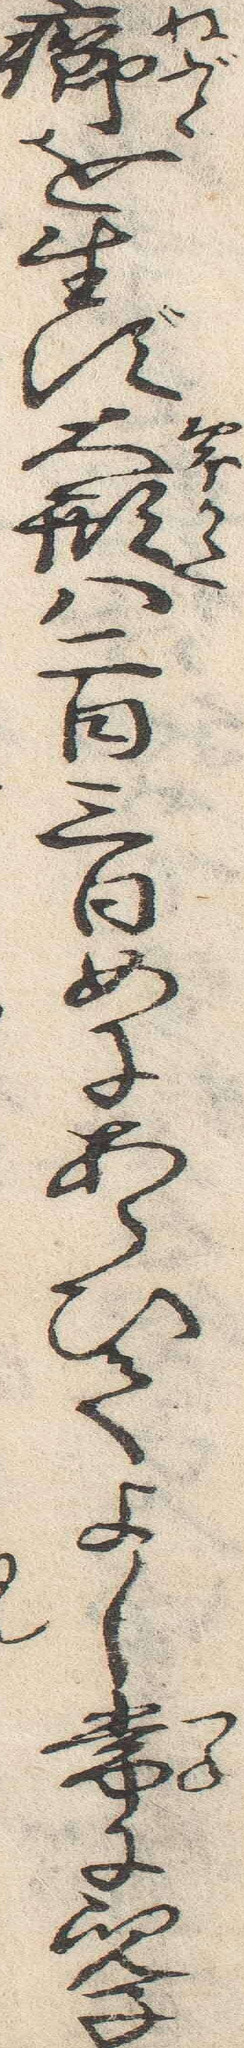癤を生ず大形は二日三日めにあらひてよし常に児子
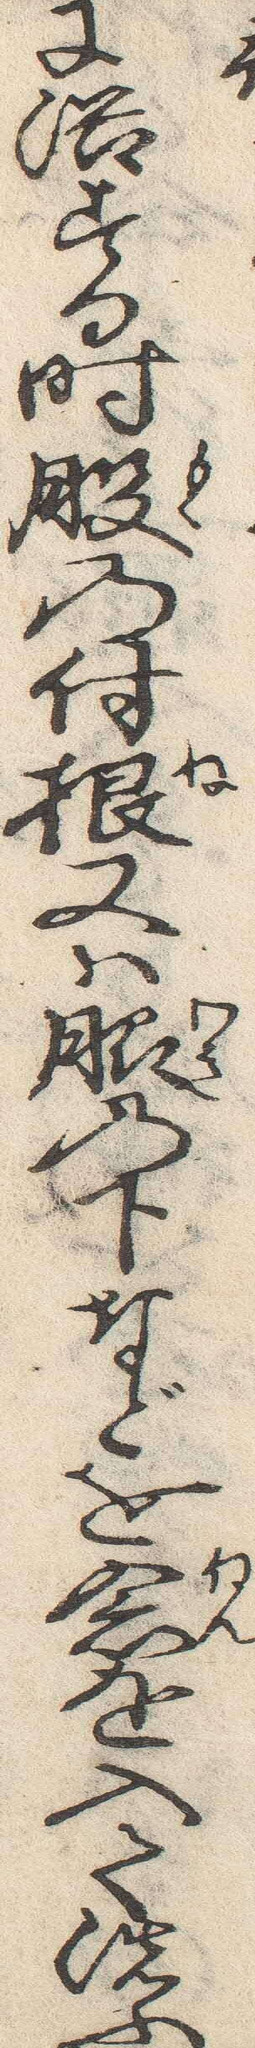に浴する時股の付根又は脇の下などを念を入て洗ふ
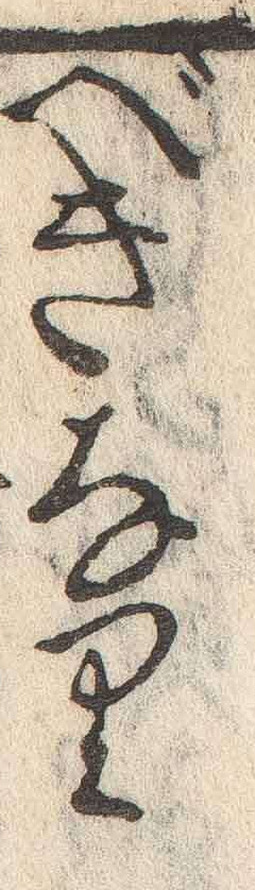べきなり
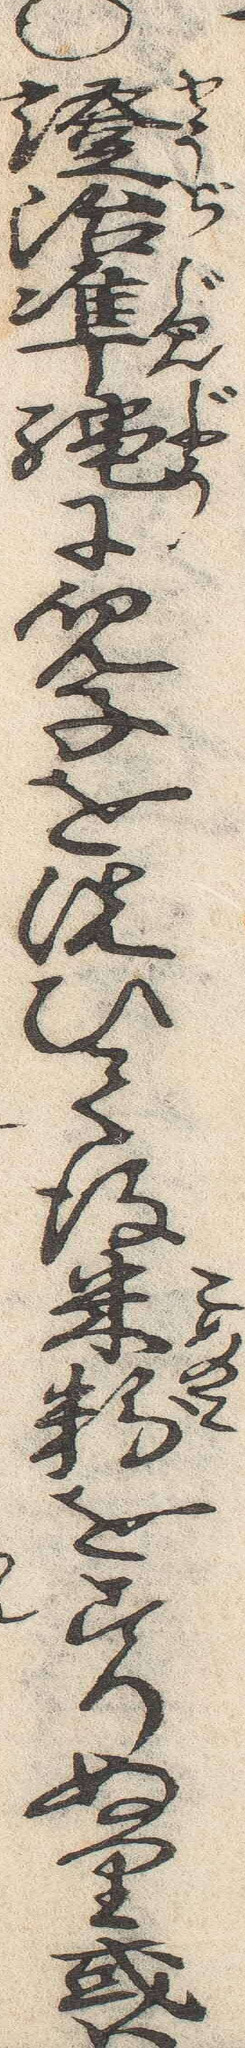◯證治準縄に児子を洗ひてのち米粉をすりぬり或は
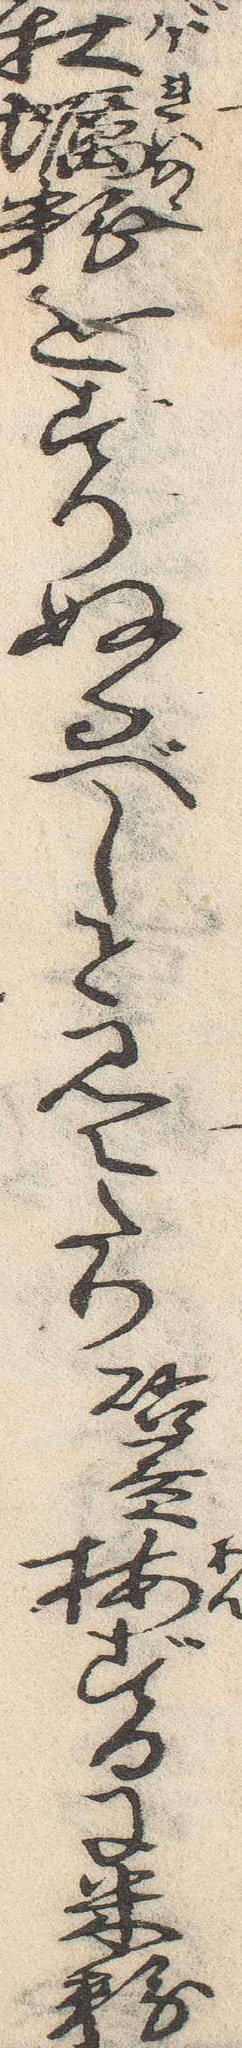牡蠣粉をすりぬるべしと見えたり啓益按ずるに米粉
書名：小児必用養育草
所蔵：東京学芸大学附属図書館 国文学研究資料館
